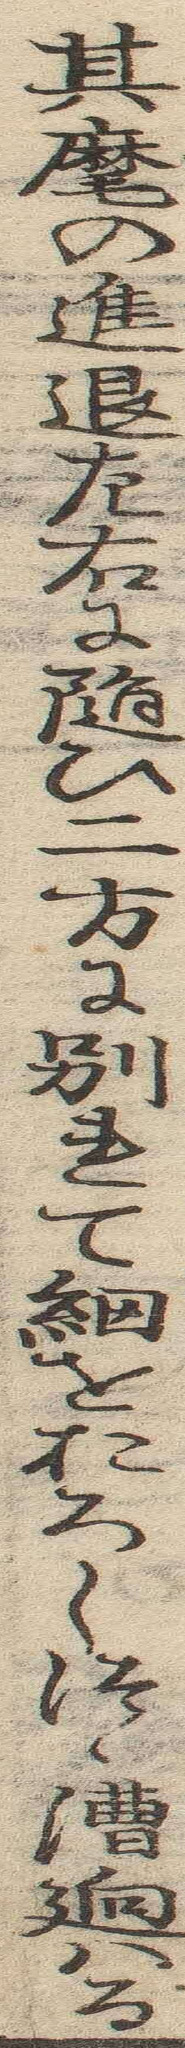其麾の進退左右に随ひ二方に別れて網をおろしつゝ漕廻はる

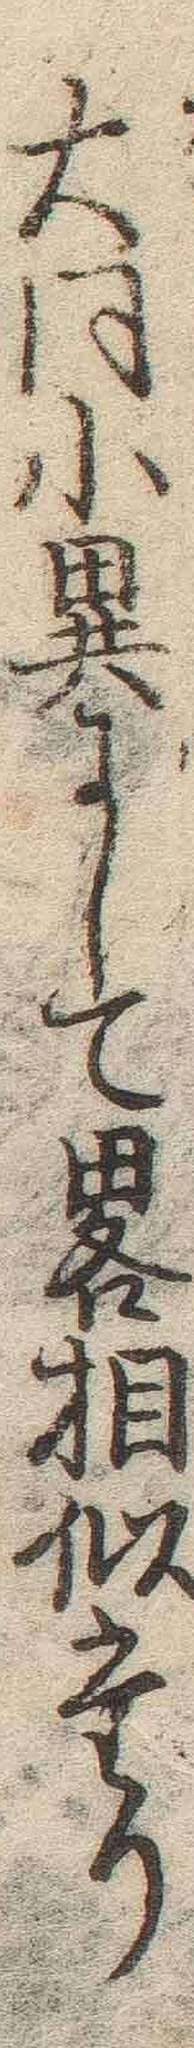大同小異にして略相似たり
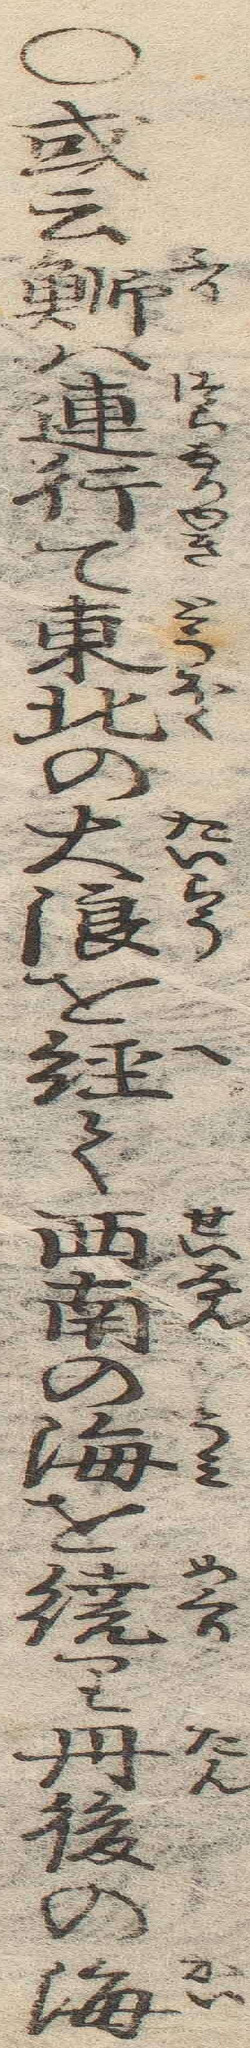○或云鰤は連行て東北の大浪を経て西南の海を繞り丹後の海
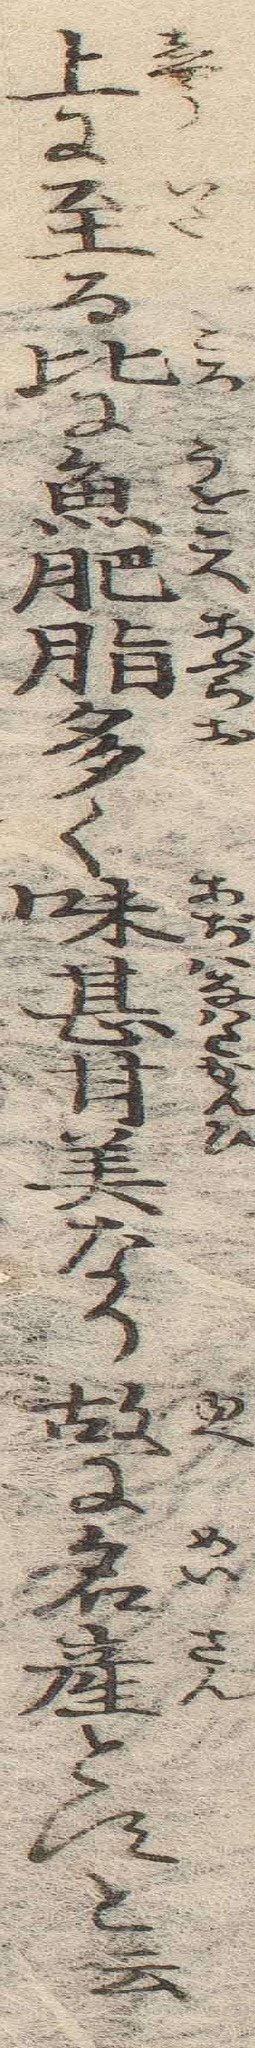上に至る比に魚肥脂多く味甚甘美なり故に名産とすと云
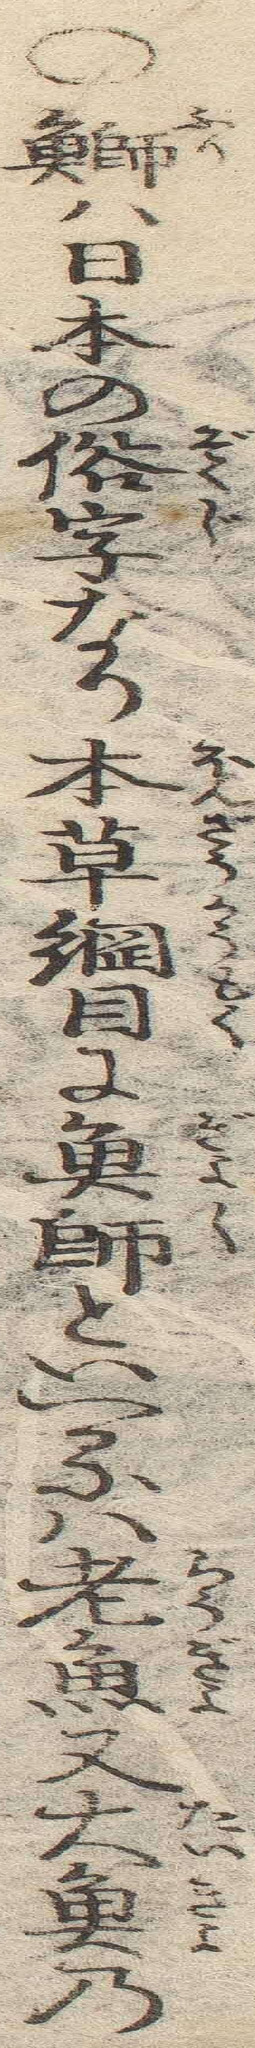○鰤は日本の俗字なり本草綱目に魚師といへるは老魚又大魚の
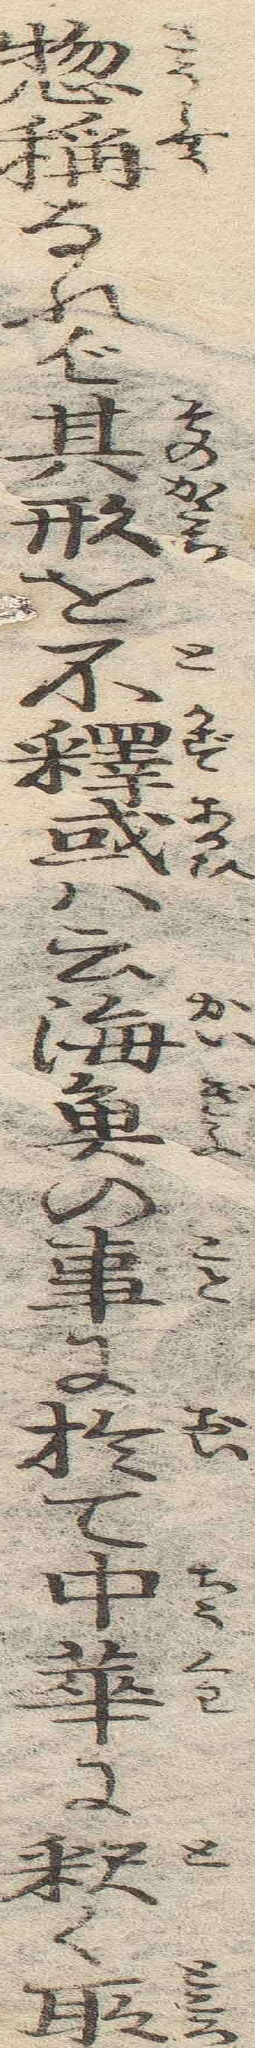惣称なれば其形を不釈或は云海魚の事に於て中華に釈く所
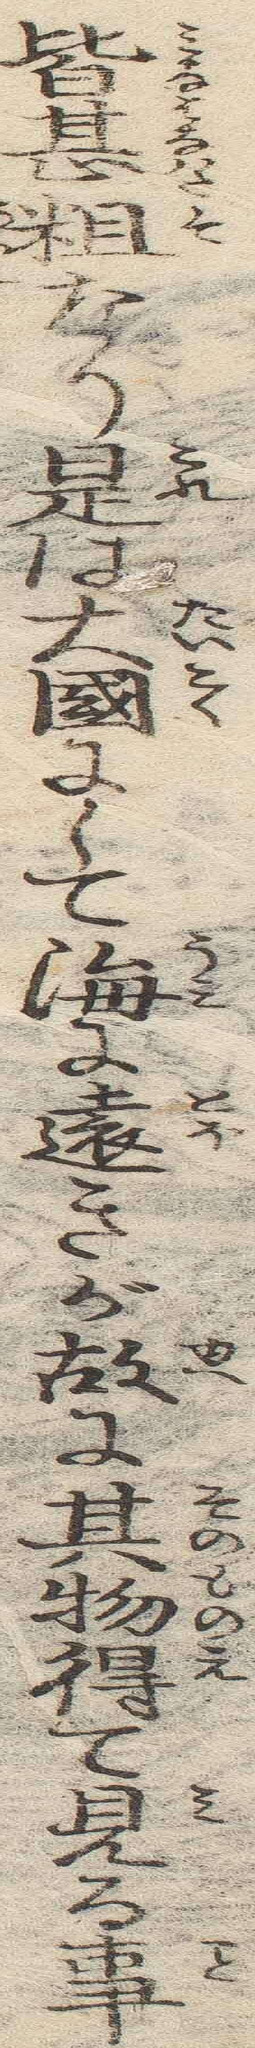皆甚粗なり是は大国にして海に遠きが故に其物得て見る事
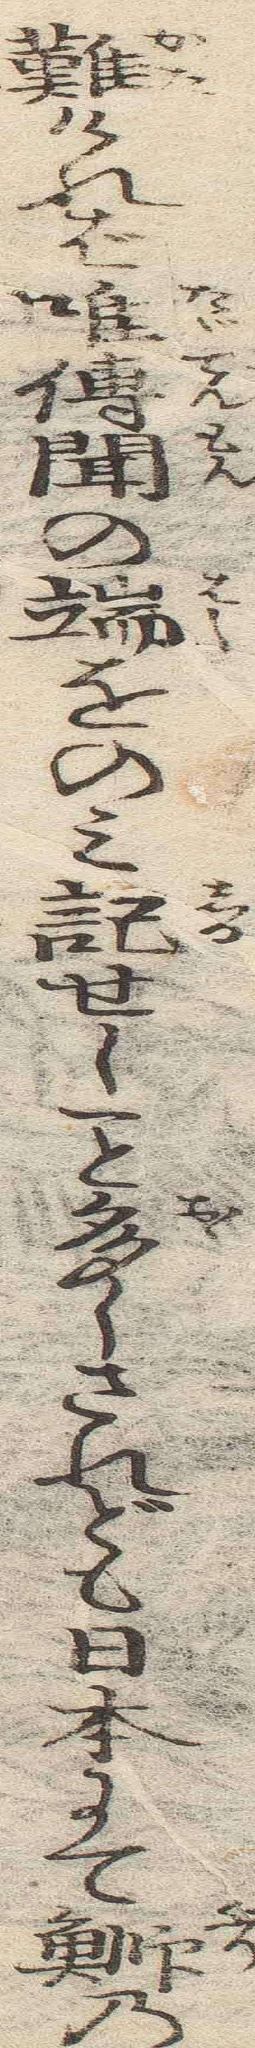難ければ唯伝聞の端をのみ記せしこと多しされども日本にて鰤の
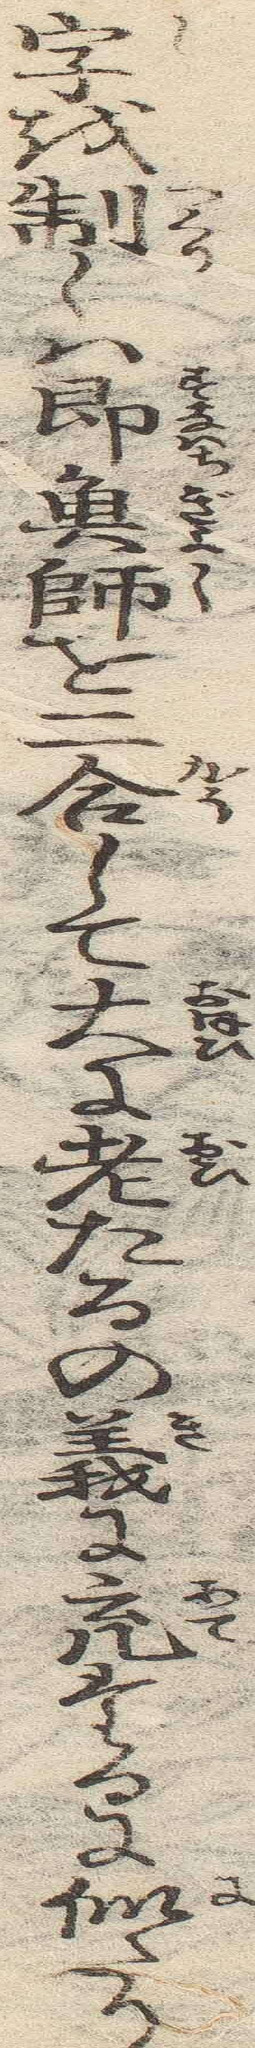字を制しは即魚師を二合して大に老たるの義に充たるに似たり
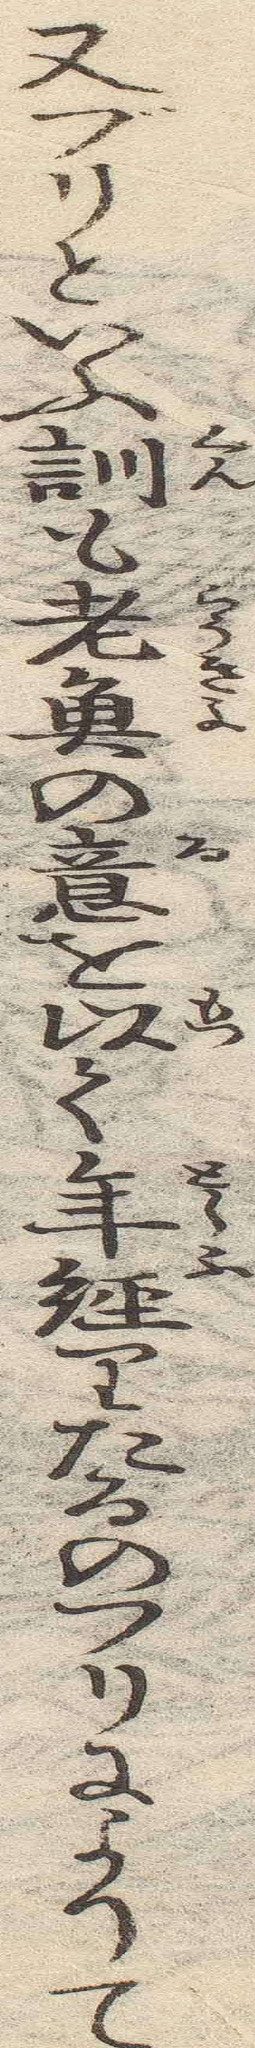又ブリといふ訓も老魚の意を以て年経りたるのフリによりて
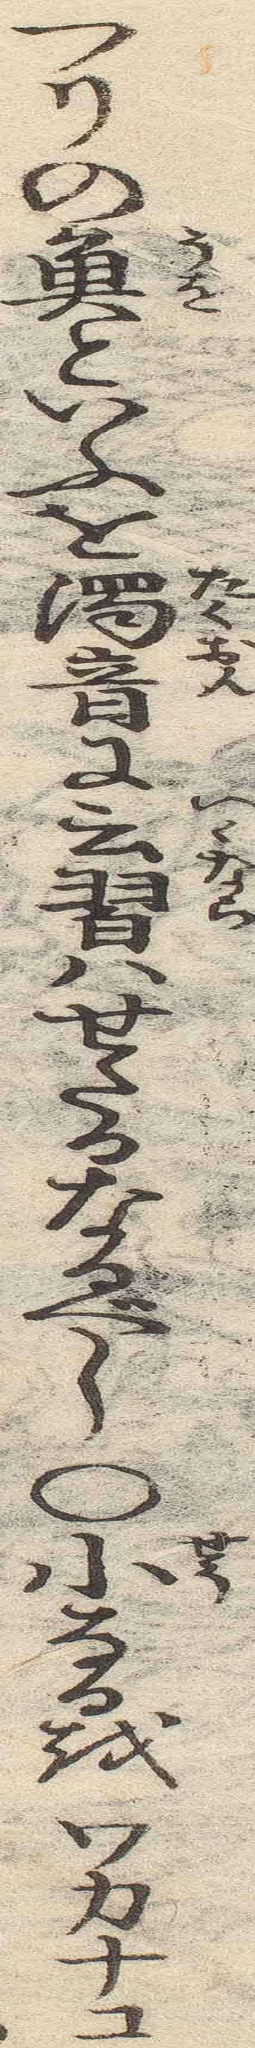フリの魚といふを濁音に云習はせたるなるべし○小なるをワカナコ
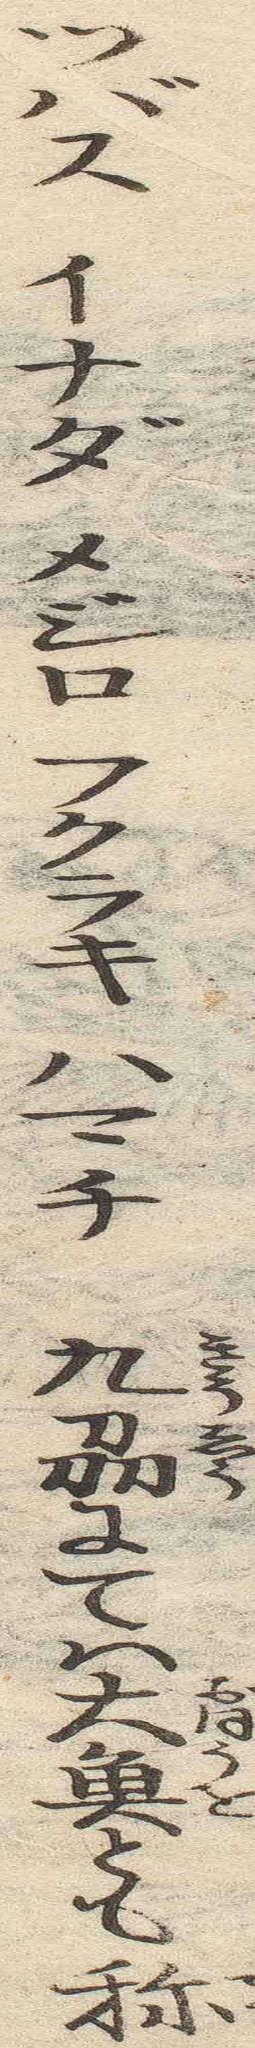ツバスイナダメジロフクラキハマチ九州にては大魚とも称
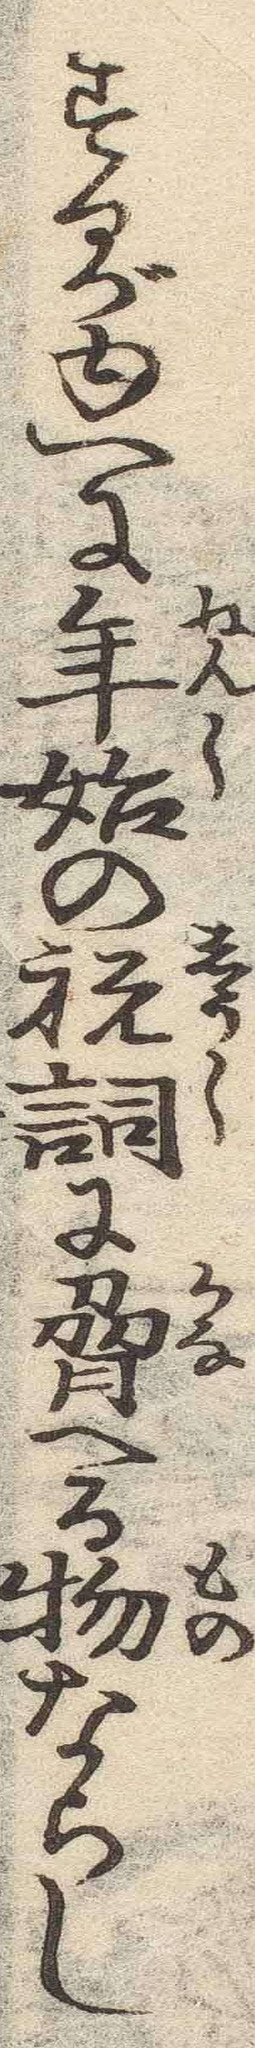するがゆへに年始の祝詞に脋へる物ならし
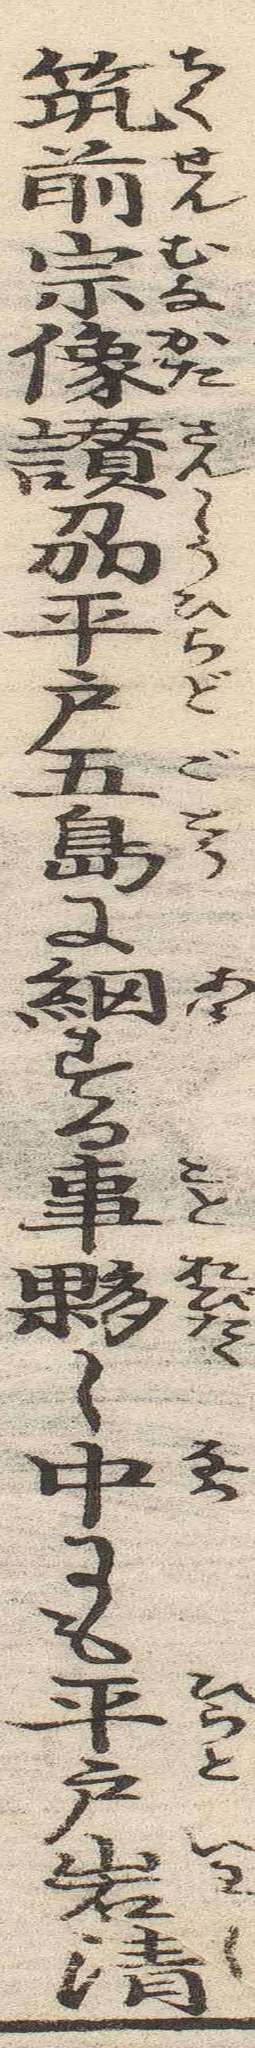筑前宗像讃州平戸五島に網する事夥し中にも平戸岩清
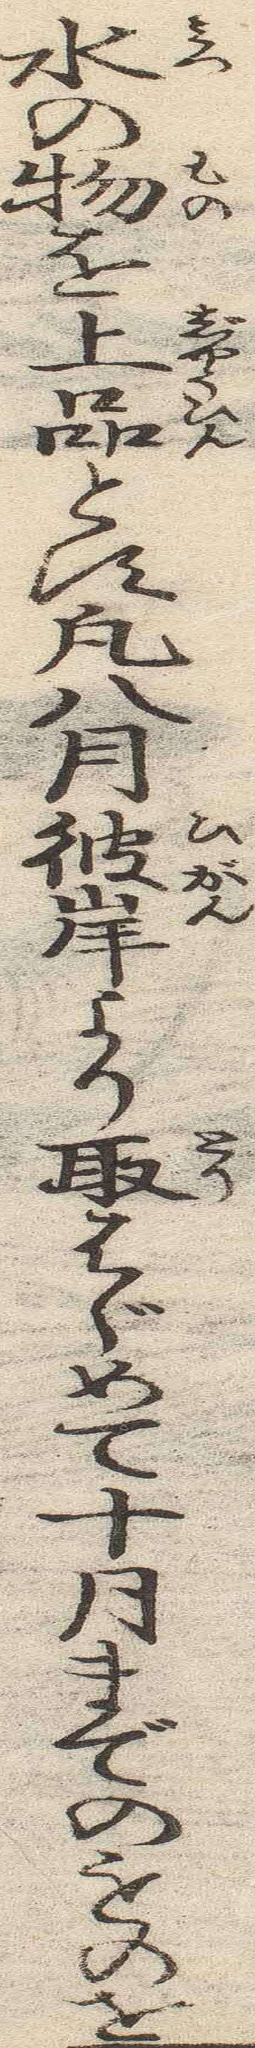水の物を上品とす凡八月彼岸より取はじめて十月までのものを
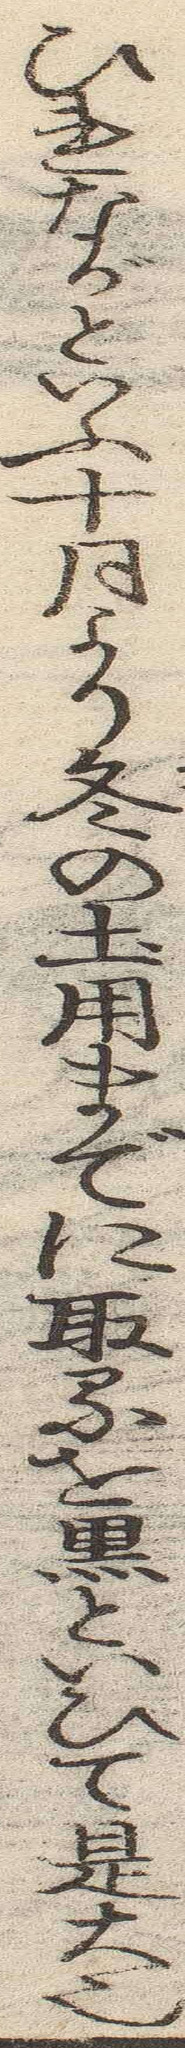ひれながといふ十月より冬の土用までに取るを黒といひて是大也
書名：日本山海名産図会
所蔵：東京学芸大学附属図書館 国文学研究資料館
